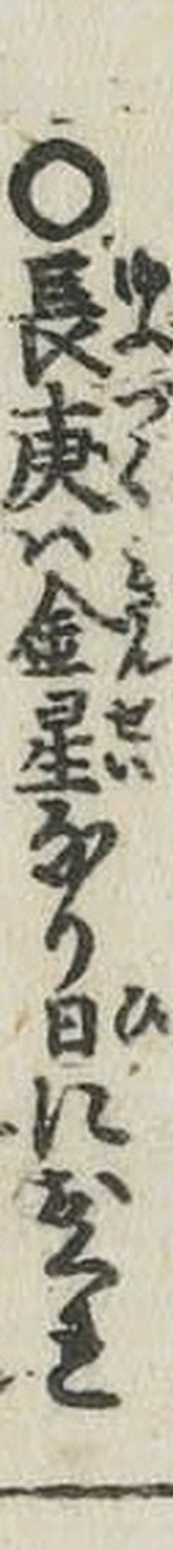○長庚は金星なり日におくれ
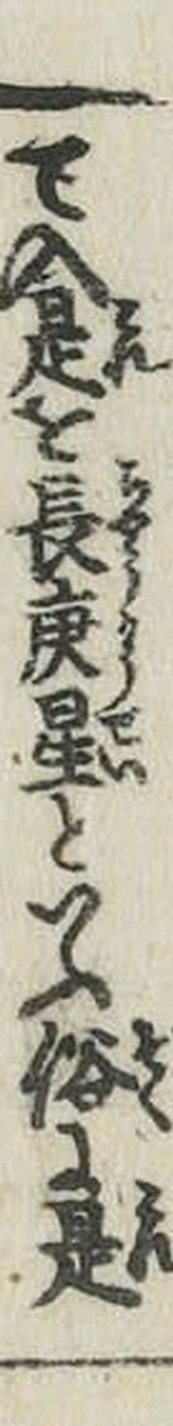て入是を長庚星といふ俗に是
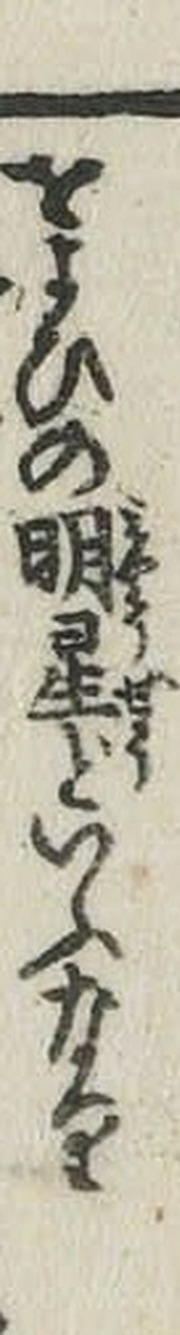をよひの明星といふなり
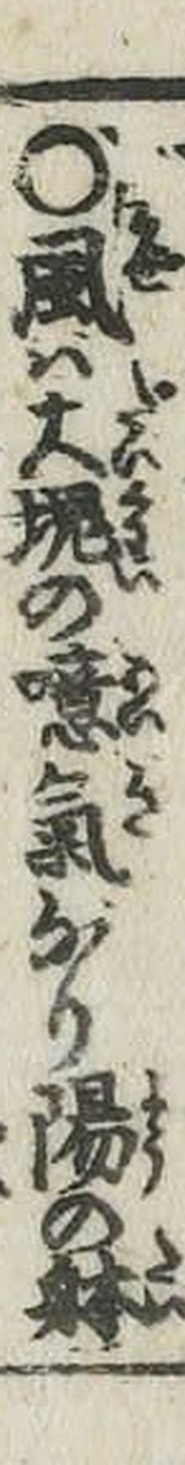○風は大塊の噫気なり陽の体
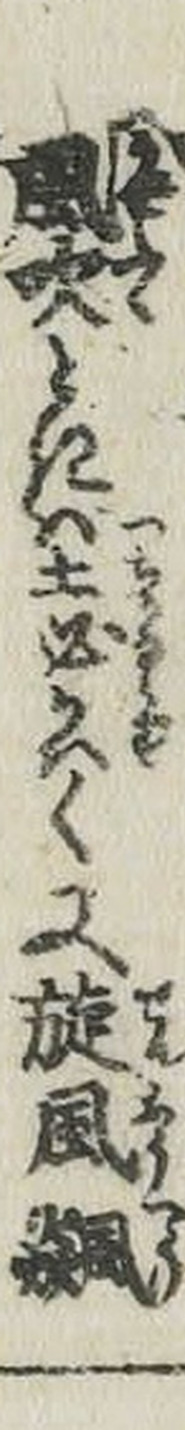風吹ときは土必かはく又旋風飊
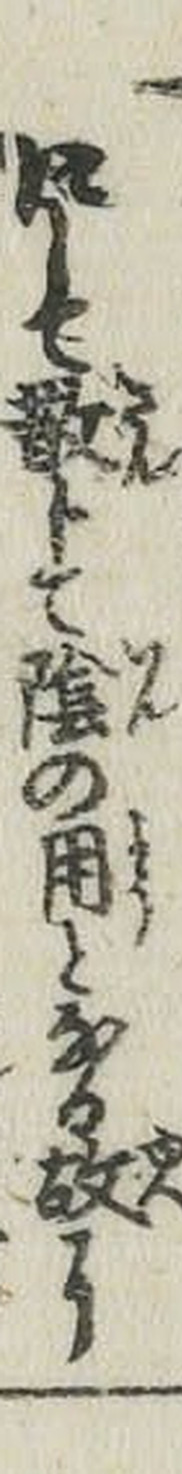にして散じて陰の用となる故に
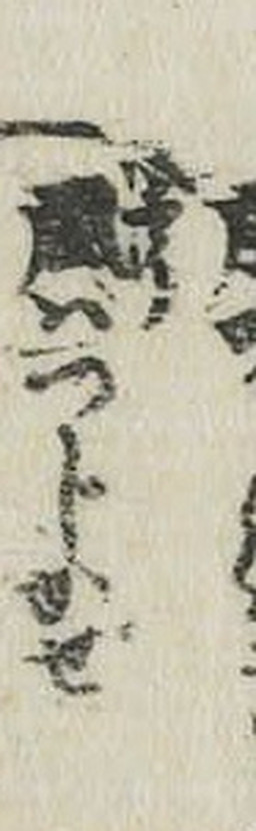風はつじかぜ
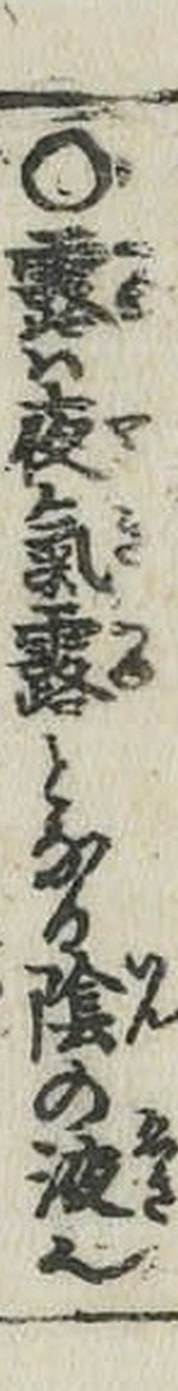○露は夜気露となる陰の液也
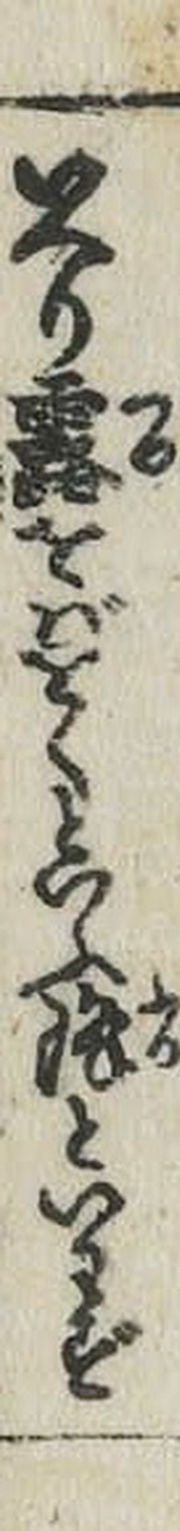いへり露をばをくといふ降とはいわず
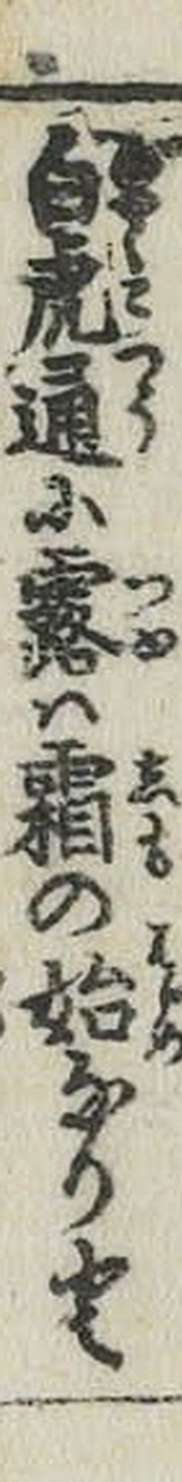白虎通に露は霜の始なりと

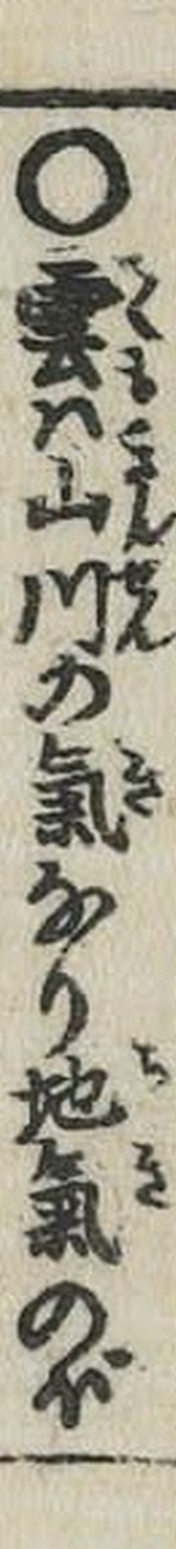○雲は山川の気なり地気のぼ
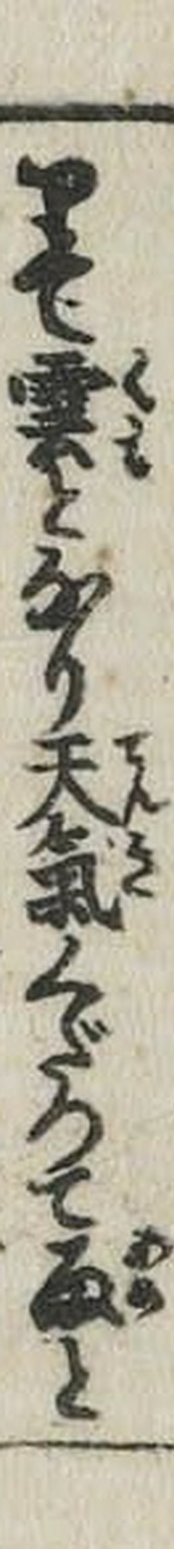りて雲となり天気くだつて雨と
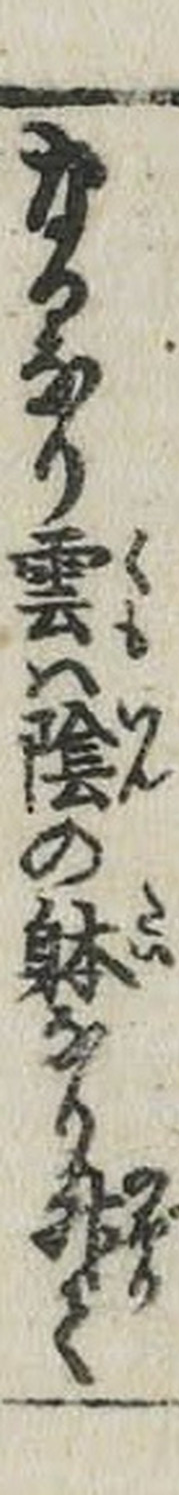なるなり雲は陰の体なり昇て
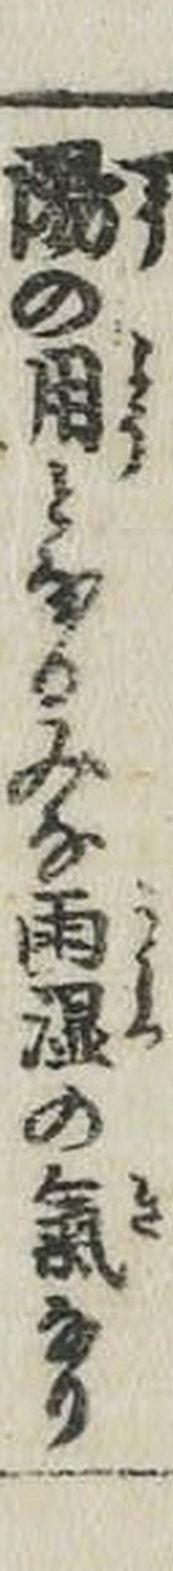陽の用となるみな雨湿の気なり
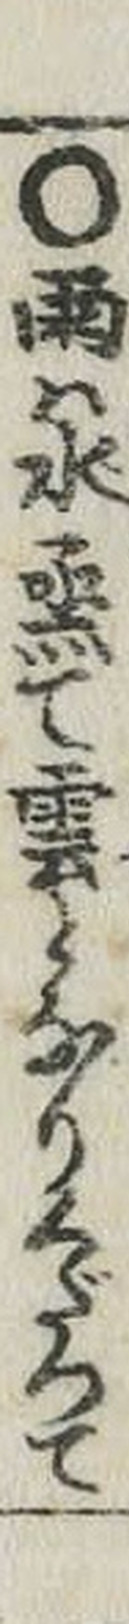○雨は水烝て雲となりくだつて
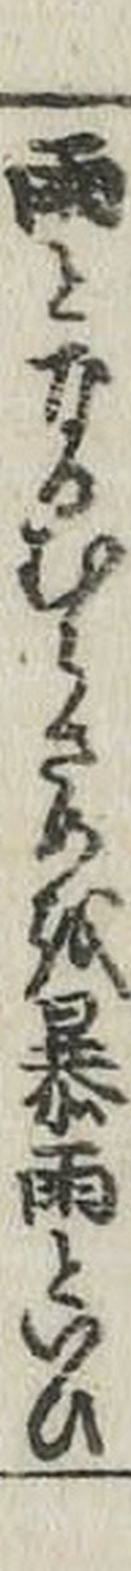雨となるむらさめを暴雨といひ
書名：増補頭書訓蒙図彙大成 10巻 2:巻之1-3
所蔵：東京学芸大学教育コンテンツアーカイブ
